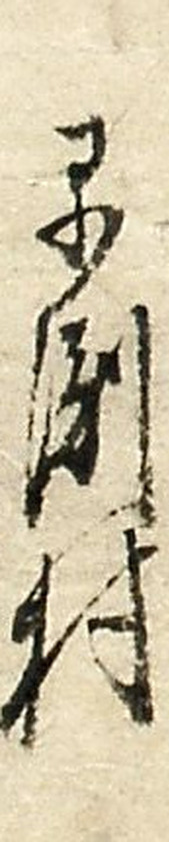早淵村
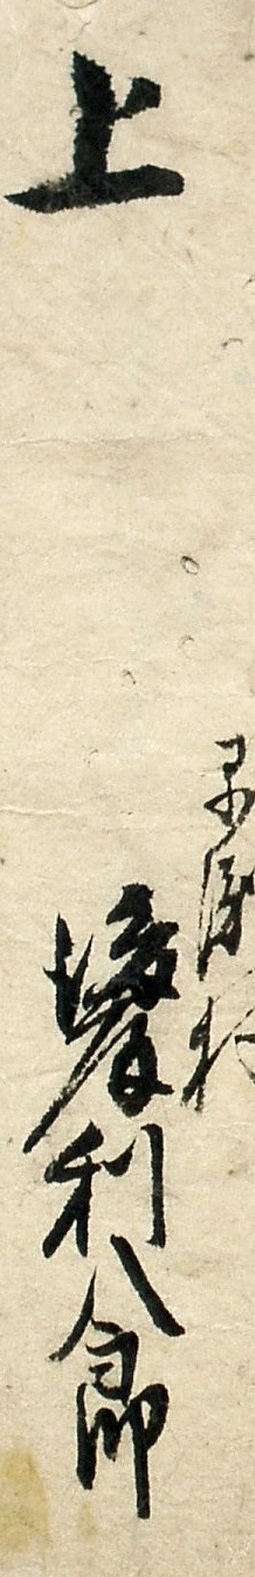上後藤利八郎

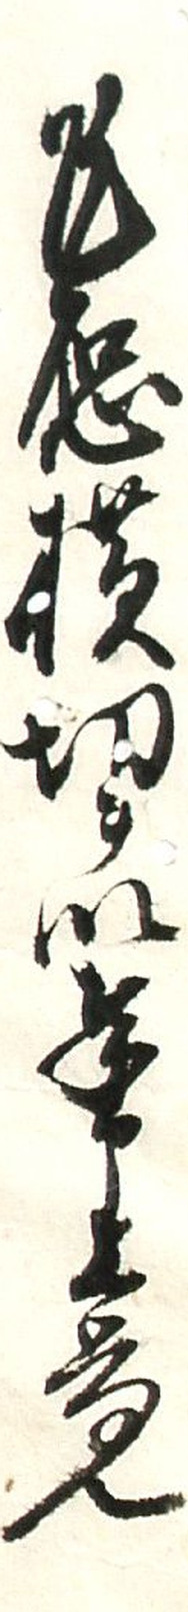乍恐横切を以奉申上覚
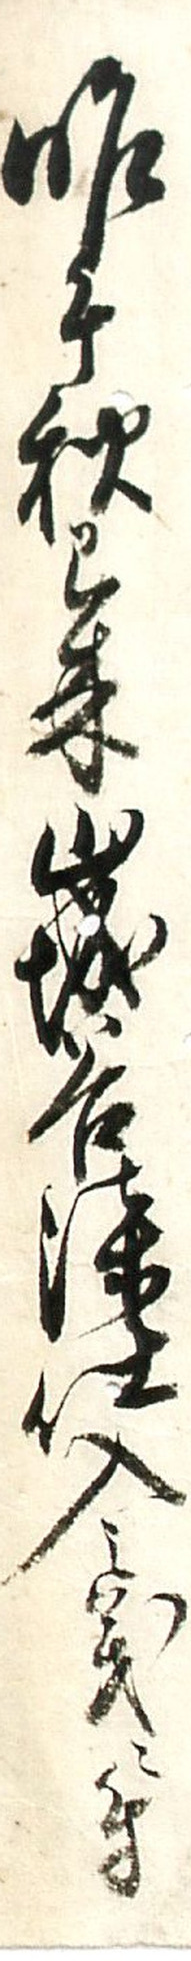昨午秋已来山城谷漆仕入之義に付
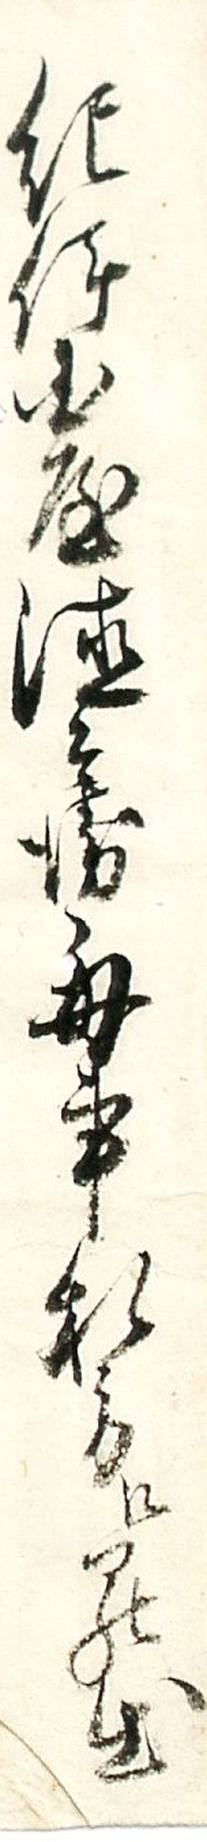紀伊国屋徳兵衛毎事私方え罷出
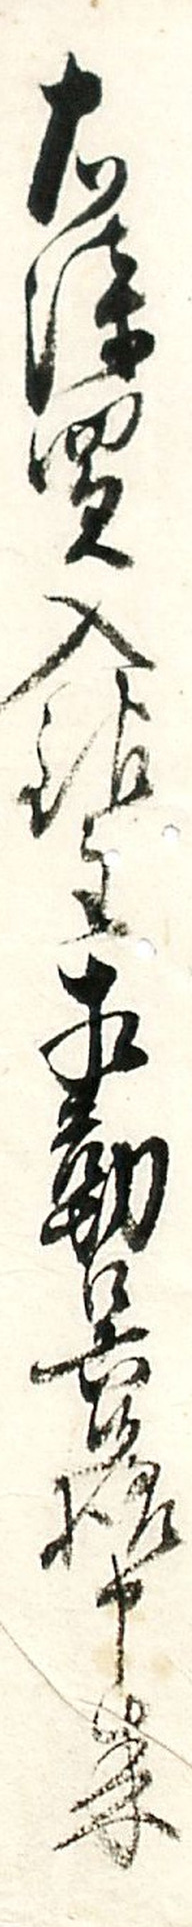右漆買入銀主相勤呉候様申来
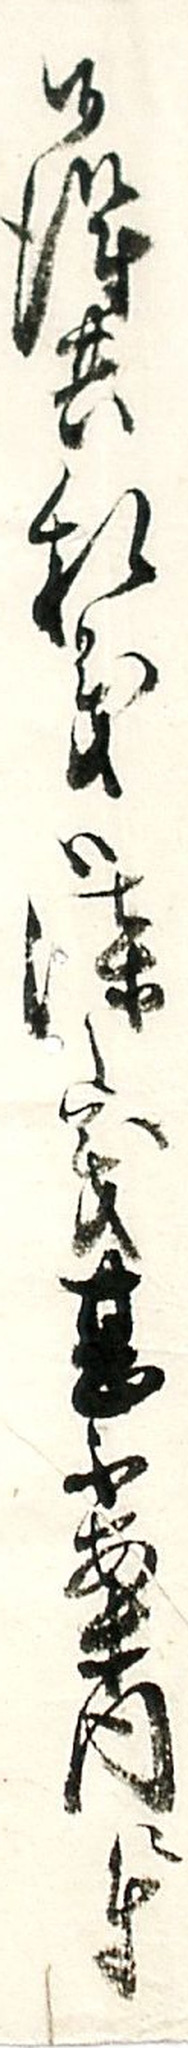候得共私義は漆之義甚不案内に付
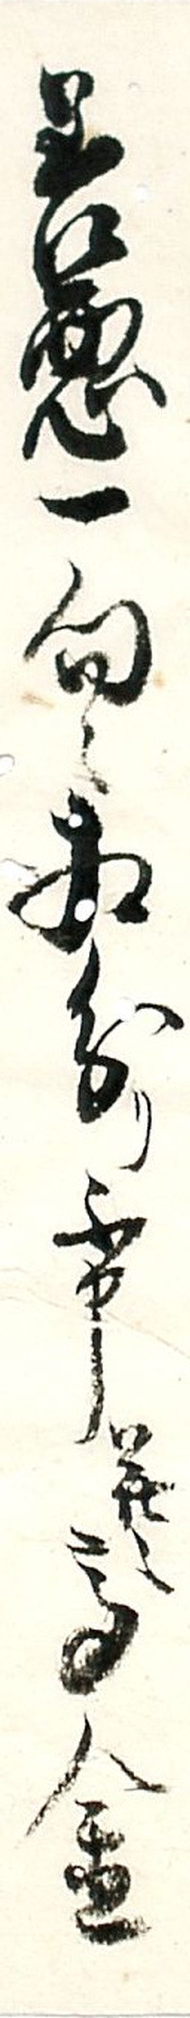善悪一向に相分り不申幷に高金
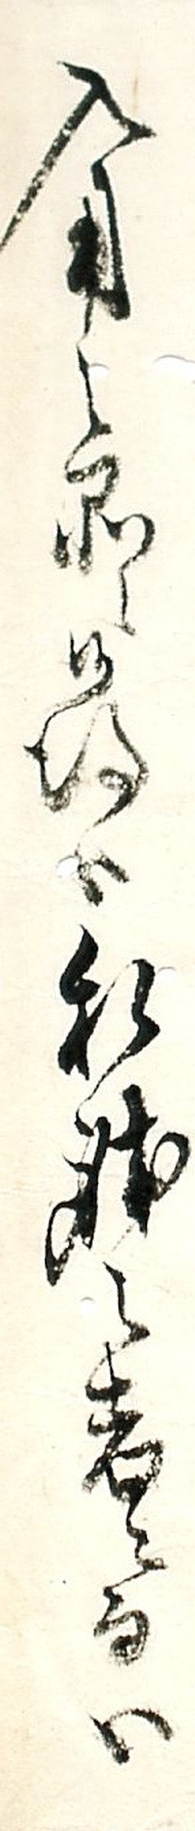入用之品に候得は私躰之者に而は
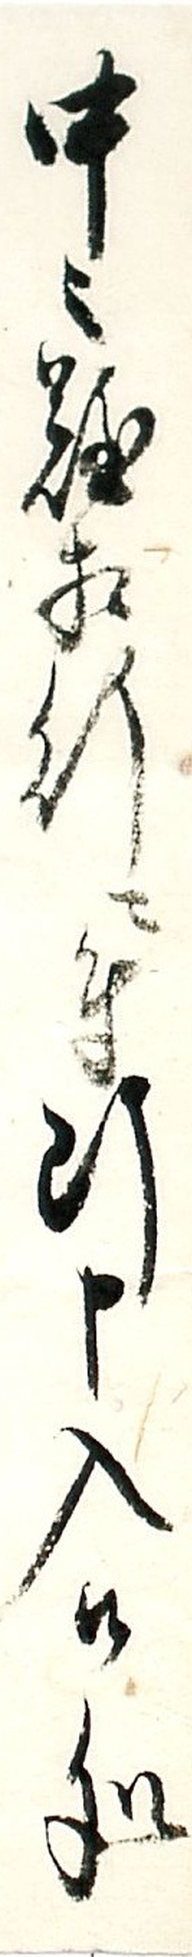中々難相行に付断申入候処
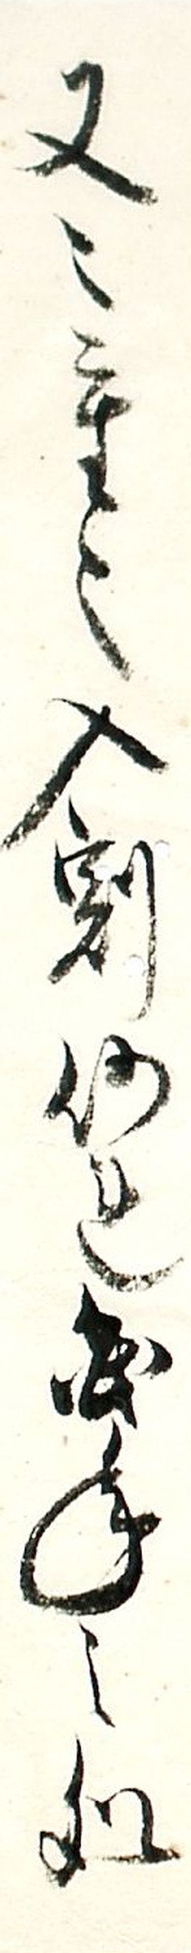又ゝ重々入割何れ当年之処
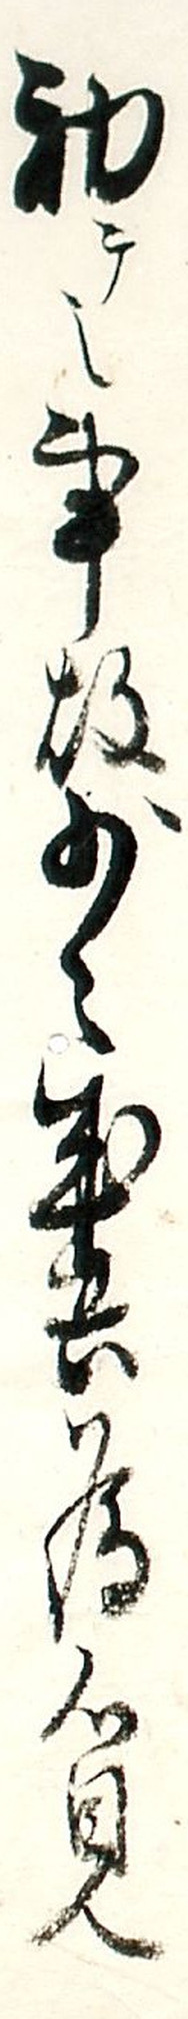初て之事故少々成共為心見
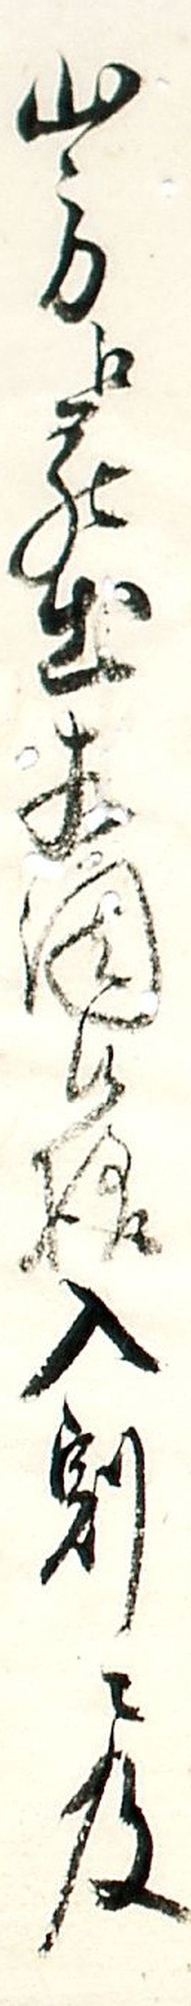山方え罷出相調候様入割に及
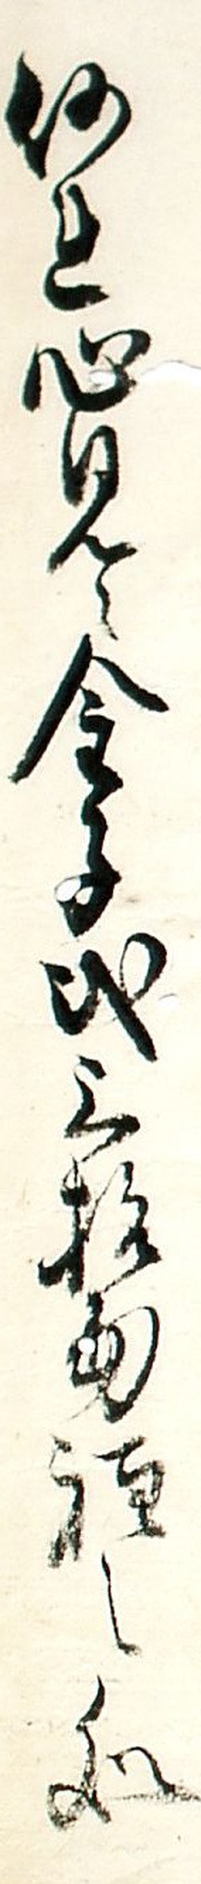何れ心見に金子弐三拾両程之処
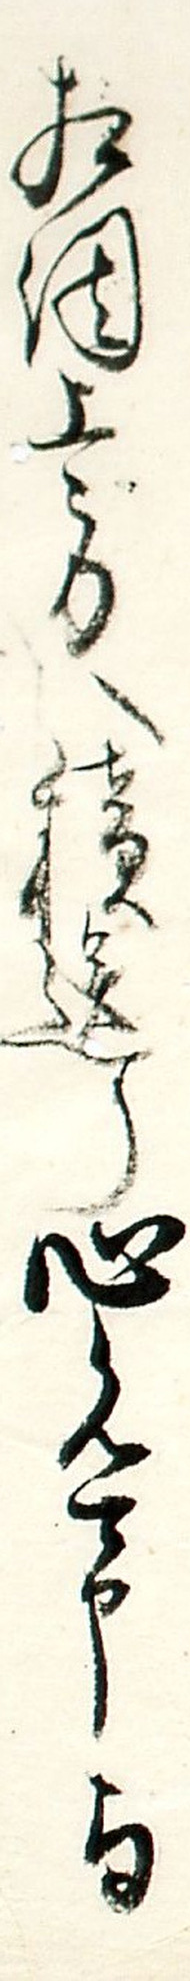相調上方へ積送り心見可申と
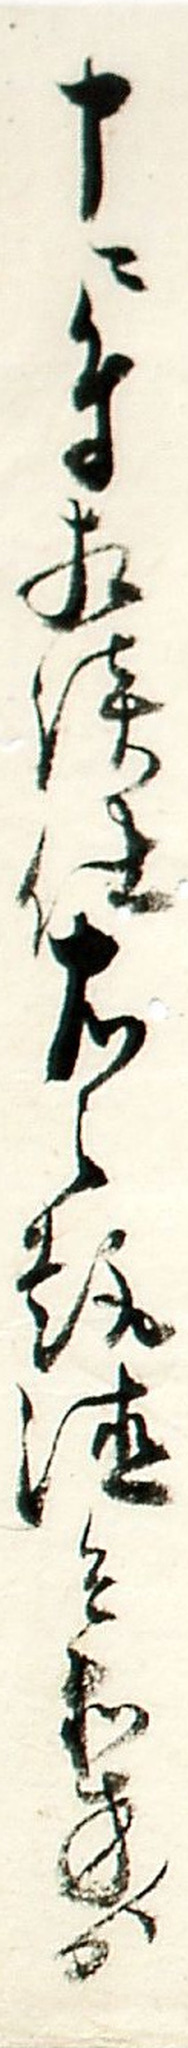申に付相談仕右之趣徳兵衛方ゟ
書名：乍恐横切ヲ以奉申上覚（山城谷漆買入銀一件ニ付）
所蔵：鳴門教育大学 Naruto University of Education
